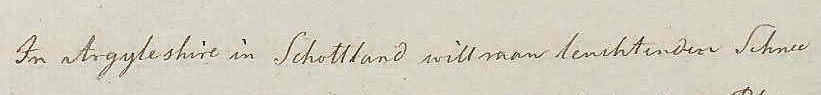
In Argyleshire in Schottland will man leuchtenden Schnee
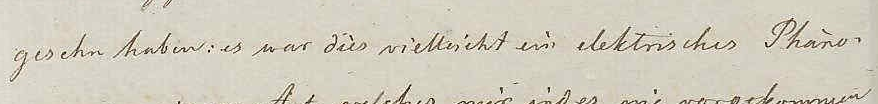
gesehn haben: es war dies vielleicht ein elektrisches Phäno-
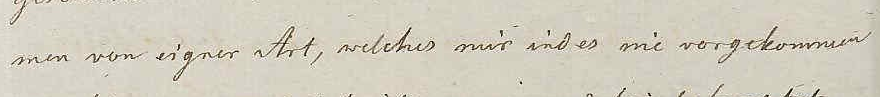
men von eigner Art, welches mir indes nie vorgekommen
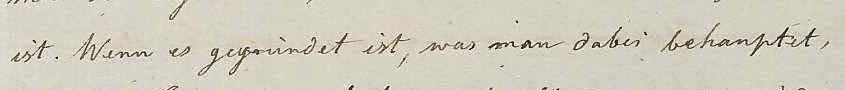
ist. Wenn es gegründet ist, was man dabei behauptet,
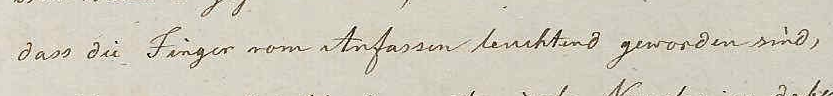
dass die Finger vom Anfassen leuchtend geworden sind,
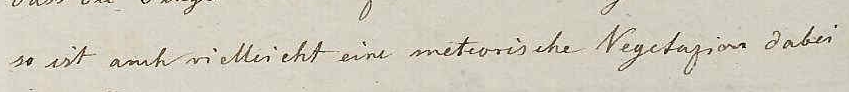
so ist auch vielleicht eine meteorische Vegetazion dabei
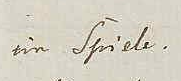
im Spiele.
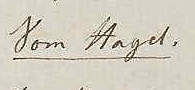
Vom Hagel.
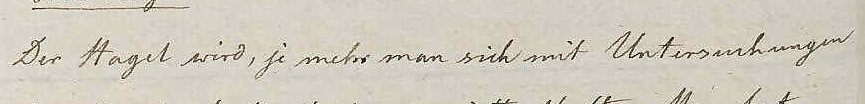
Der Hagel wird, je mehr man sich mit Untersuchungen
